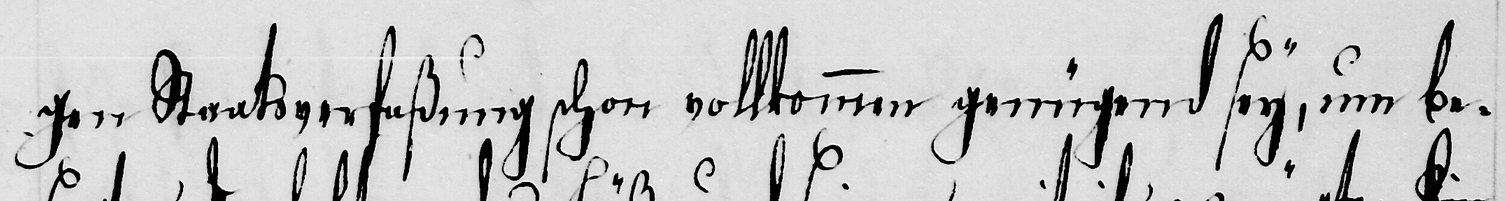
gen Staatsverfaßung schon vollkommen genügend sey, um be¬
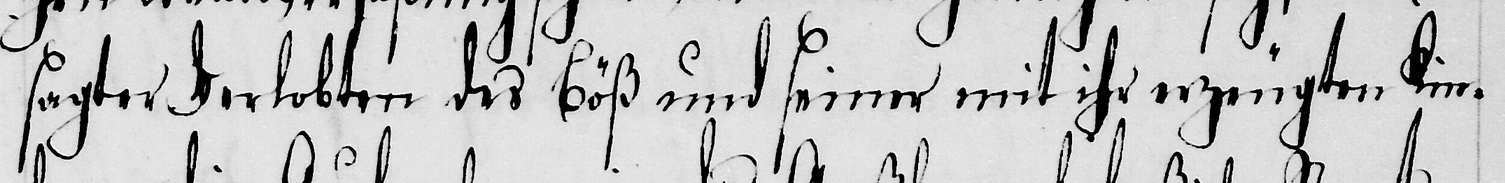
sagter Verlobten des Böß und seiner mit ihr erzeugten Kin¬
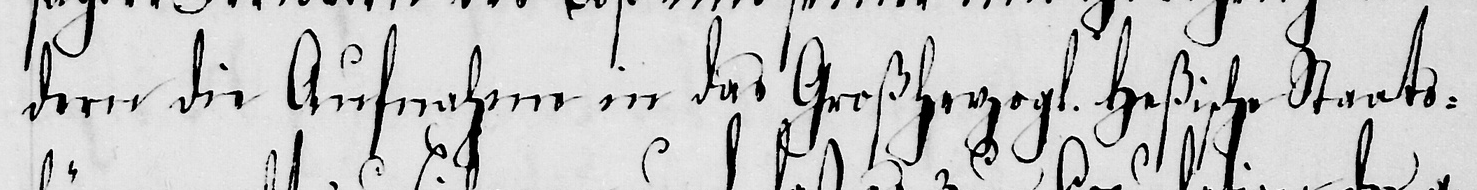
der die Aufnahme in das Großherzogl. Heßische Staats¬
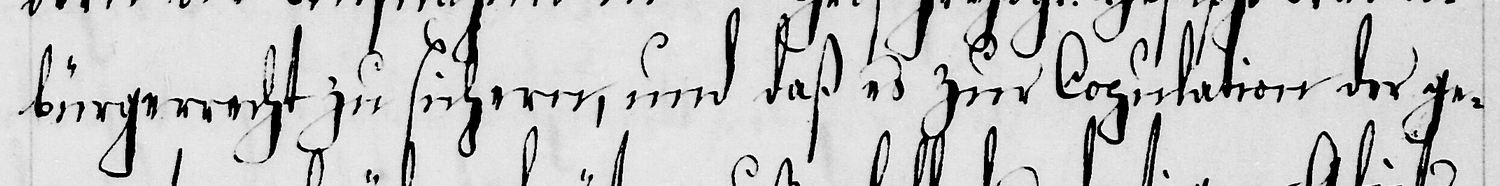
bürgerrecht zu sichern, und daß es zur Copulation der ge¬
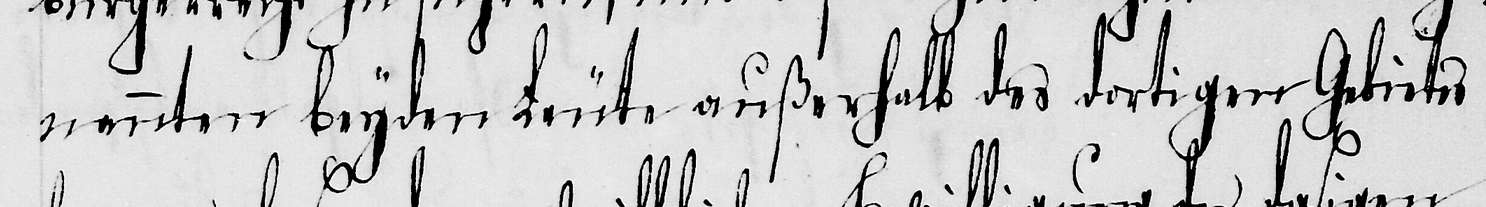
nannten beyden Leute außerhalb des dortigen Gebietes
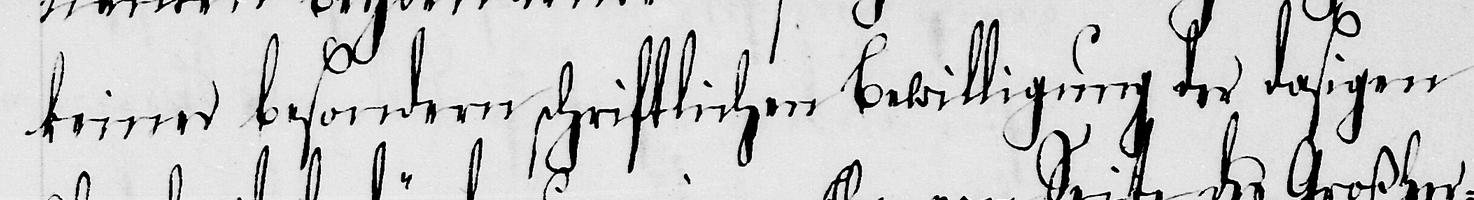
keiner besonderen schriftlichen Bewilligung der dasigen
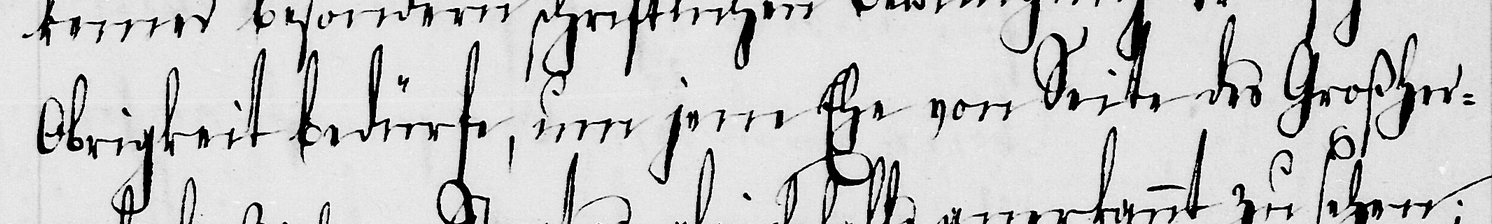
Obrigkeit bedürfe, um jene Ehe von Seite des Großher¬
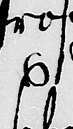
1.)
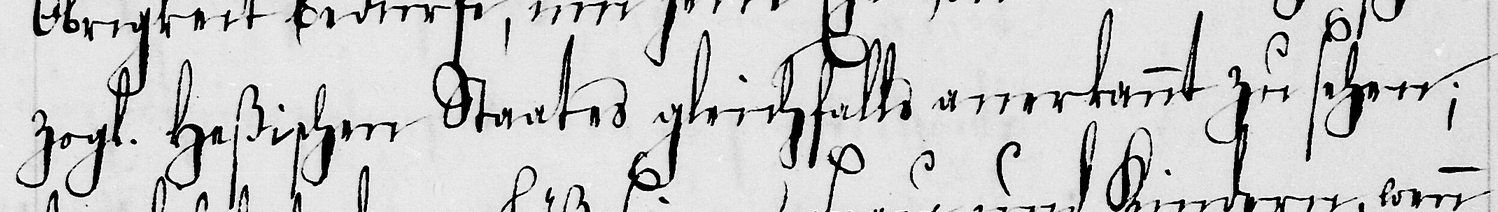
zogl. Heßischen Staates gleichenfalls anerkannt zu sehen;
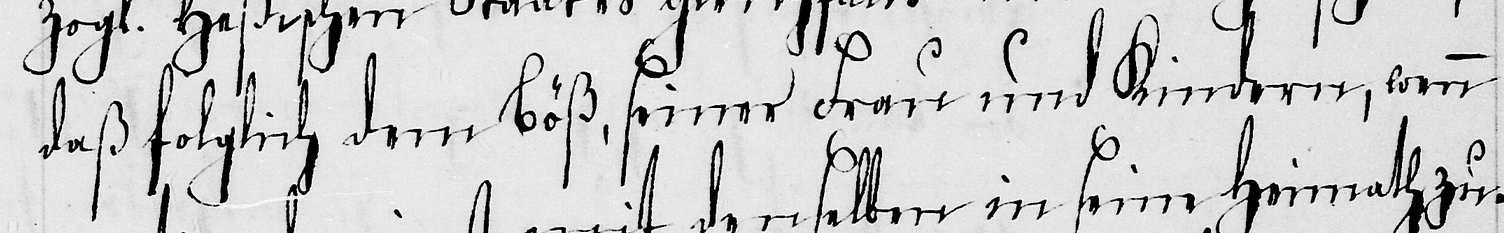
daß folglich dem Böß, seiner Frau und Kindern, wenn
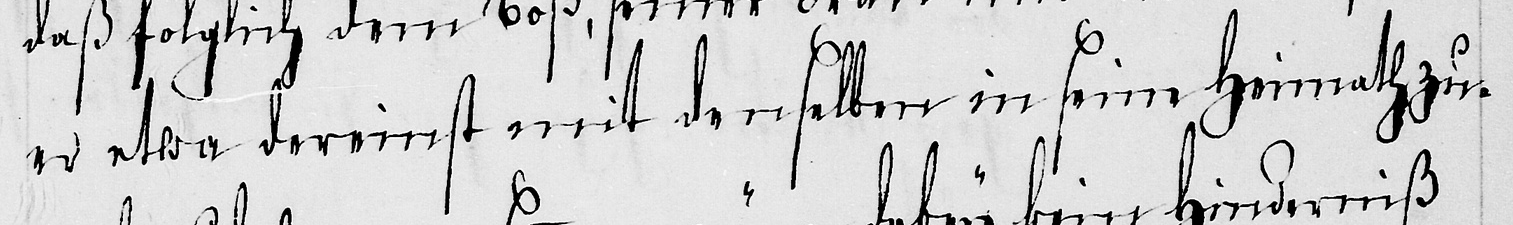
er etwa dereinst mit denselben in seine Heimath zu¬
